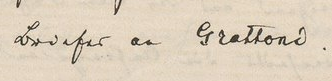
Briefes an Grattoni.
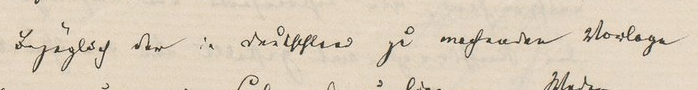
Bezüglich der in Deutschland zu machenden Vorlage
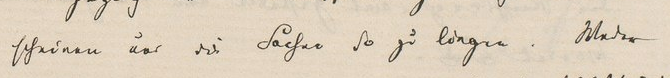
scheinen uns die Sachen so zu liegen. Weder
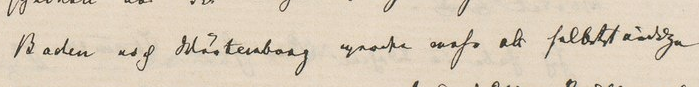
Baden noch Würtemberg werden mehr als selbstständige
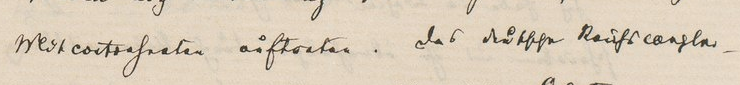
Mitcontrahenten auftreten. Das deutsche Reichscanzler-
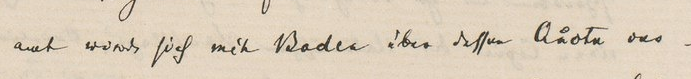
amt wird sich mit Baden über dessen Quote ver-
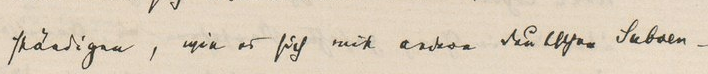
ständigen, wie es sich mit andern deutschen Subven-
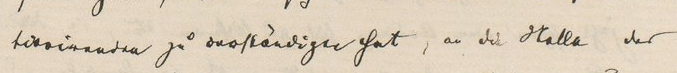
tionirenden zu verständigen hat, an die Stelle des
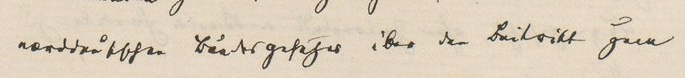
norddeutschen Bundesgesetzes über den Beitritt zum
